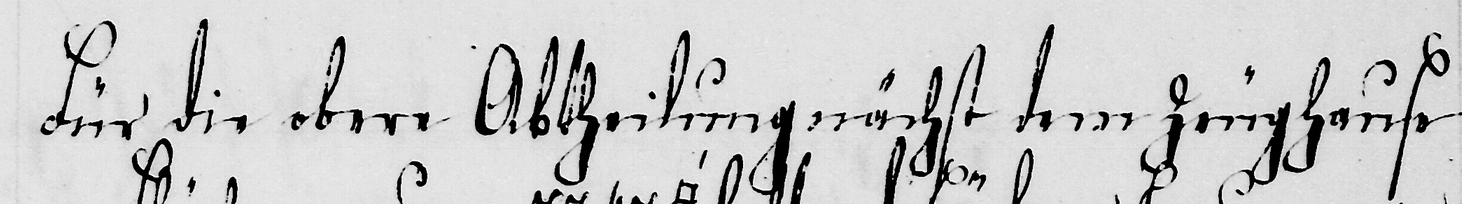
Für die obere Abtheilung nächst dem Zeughause
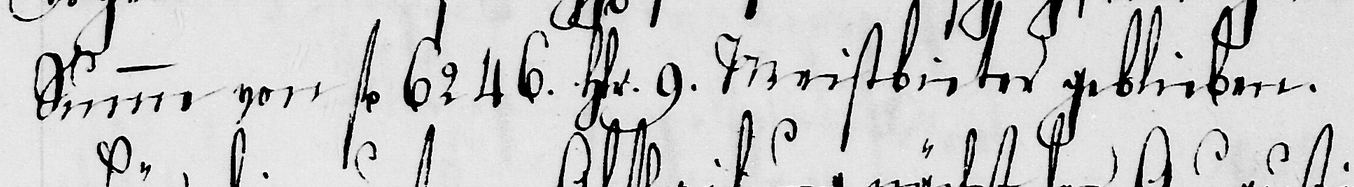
Summe von fl. 6246. Hlr. 9. Meistbieter geblieben.
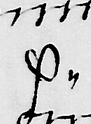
3.
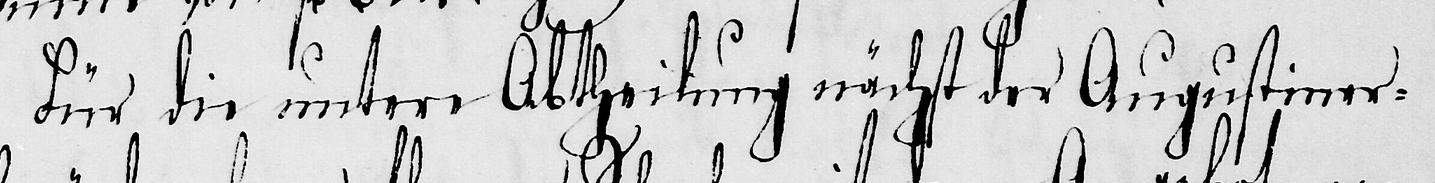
Für die untere Abtheilung nächst der Augustiner¬
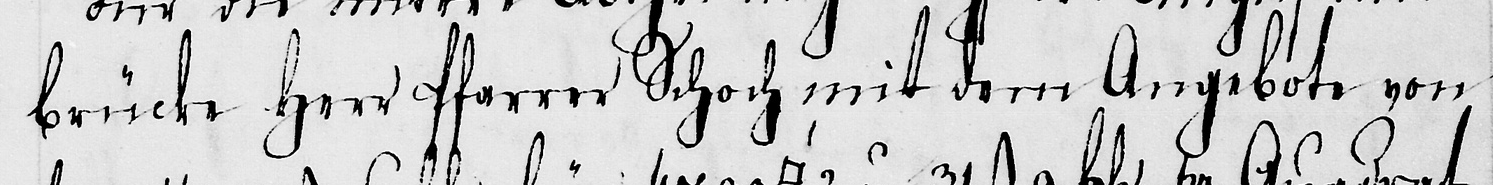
brücke Herr Pfarrer Schoch mit dem Angebote von
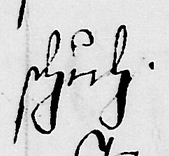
uch
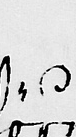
pr.
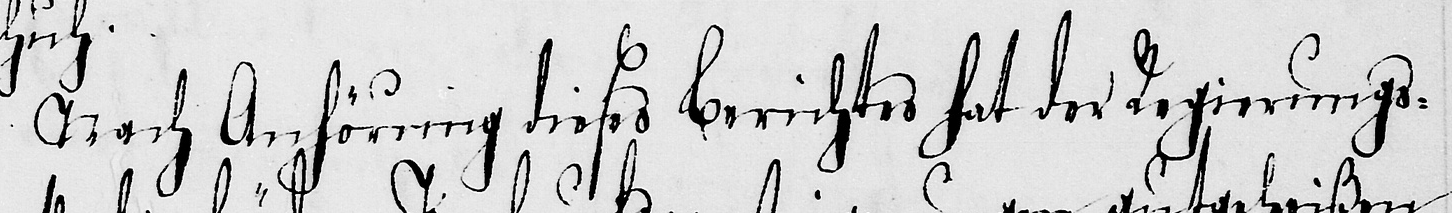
Nach Anhörung dieses Berichtes hat der Regierungs¬
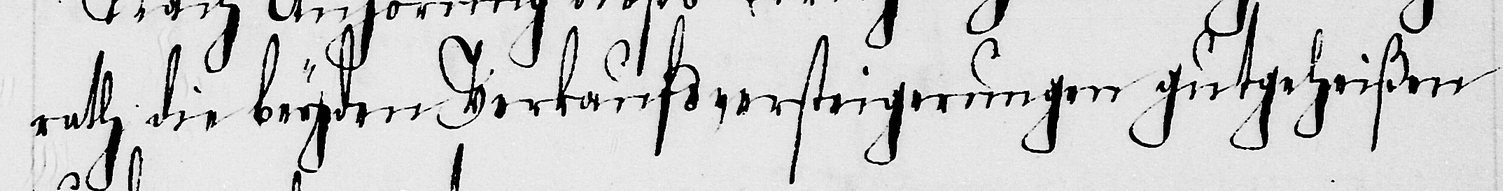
rath die beyden Verkaufsversteigerungen gutgeheißen
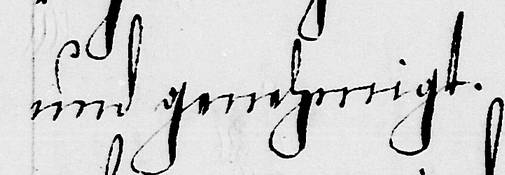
und genehmigt.
